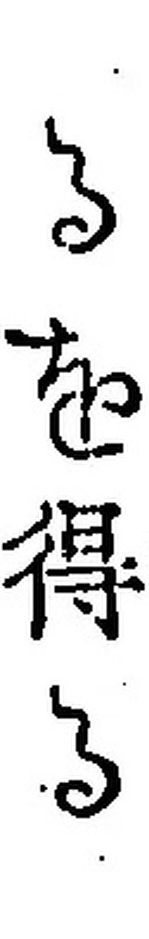るを得る
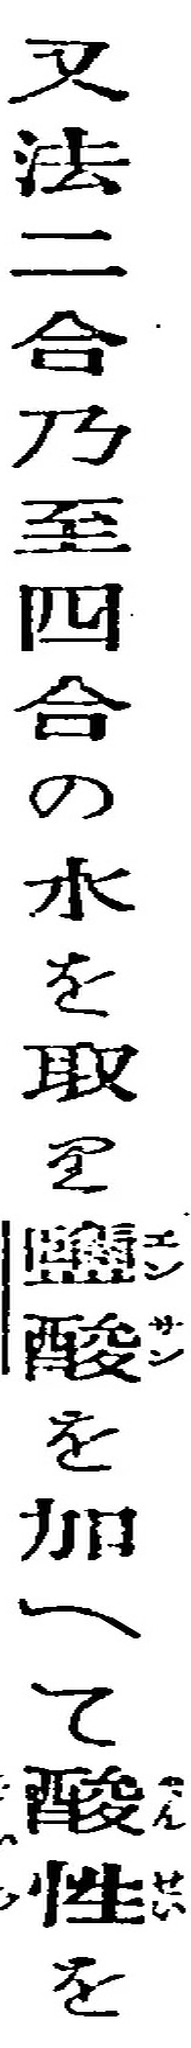又法二合乃至四合の水を取り鹽酸を加へて酸性を
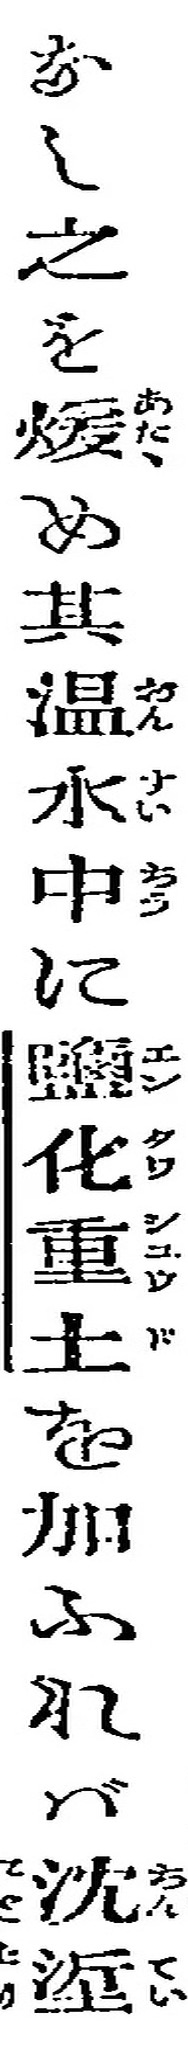なし之を煖め其温水中に鹽化重土を加ふれば沈垽
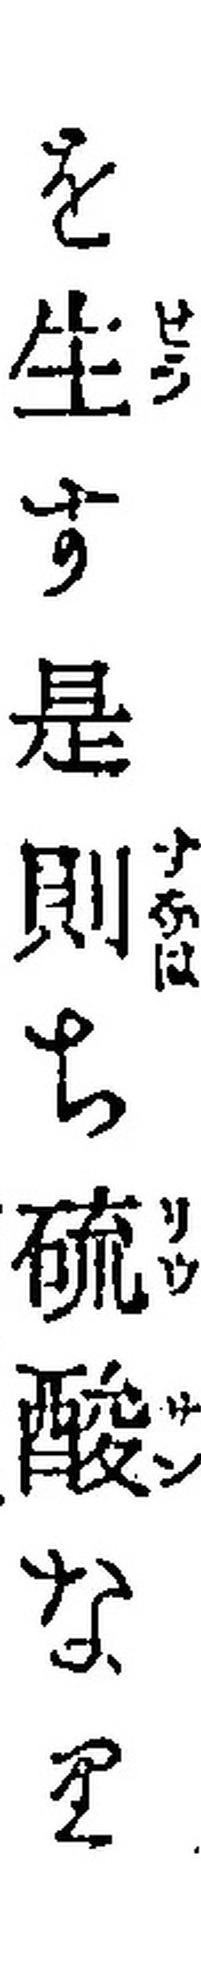を生じす是則ち硫酸なり
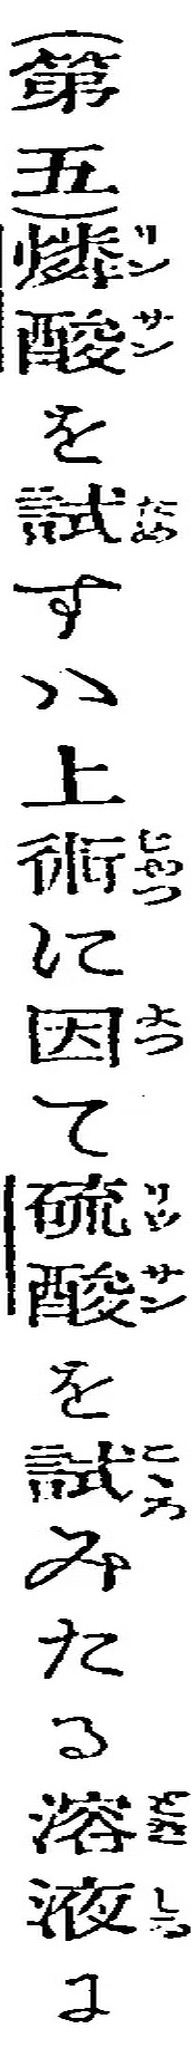[第五]燐酸を試すは上術に因て硫酸を試みたる溶液に

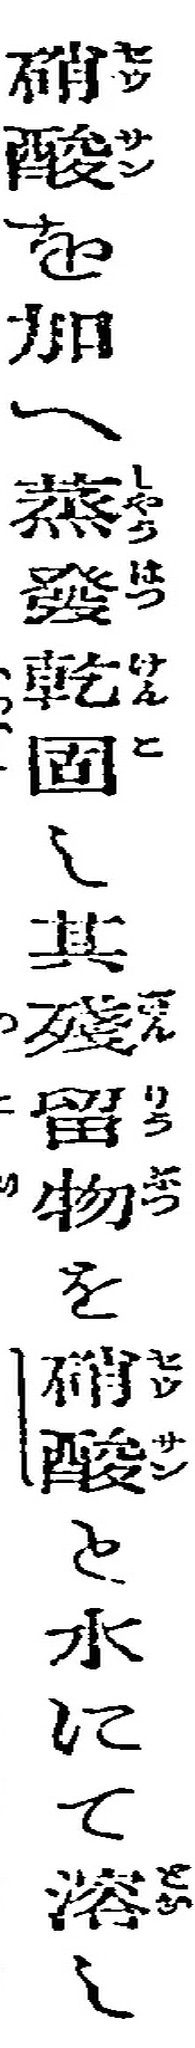硝酸を加へ蒸発乾固其残留物を硝酸と水にて溶し
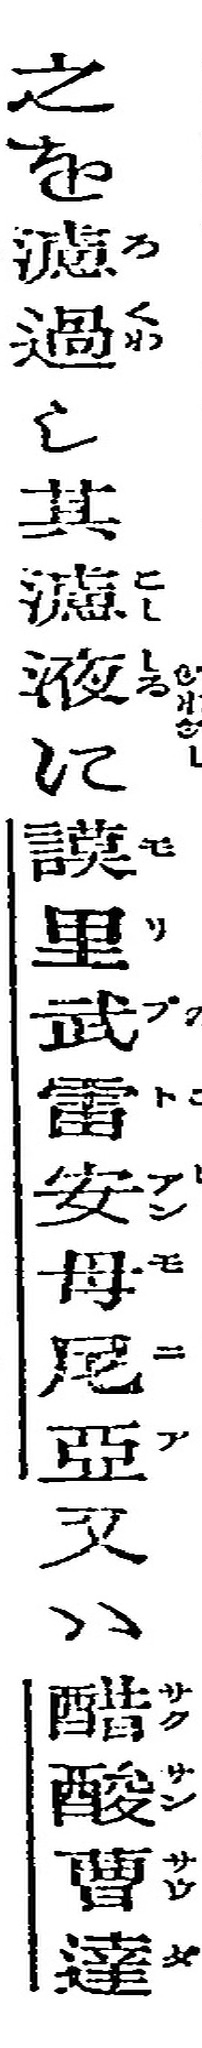之を濾過其濾液に謨里武雷安母尼亞又は醋酸曹達
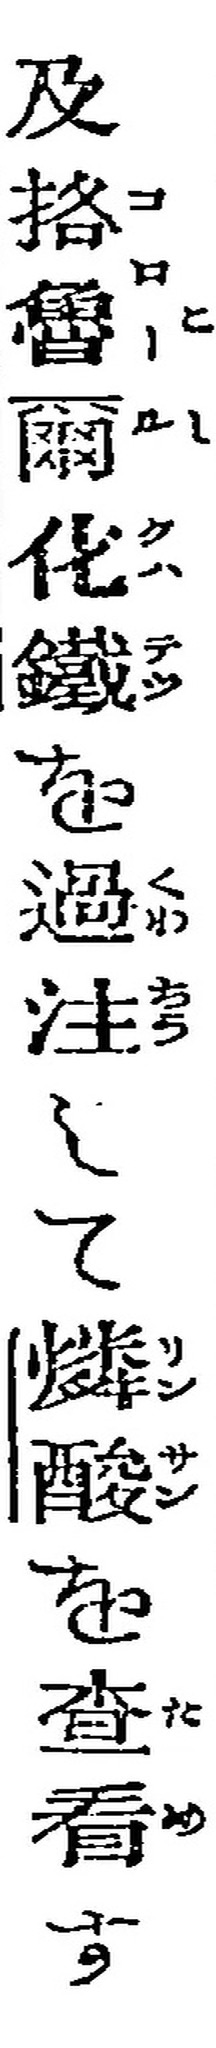及挌魯爾化鐵を過注燐酸を査看す
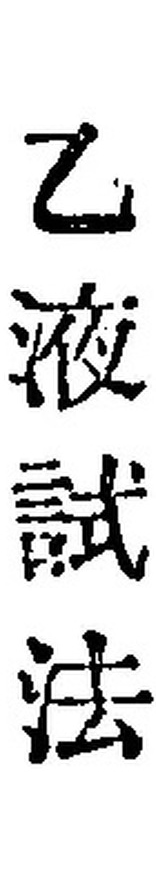乙液試法
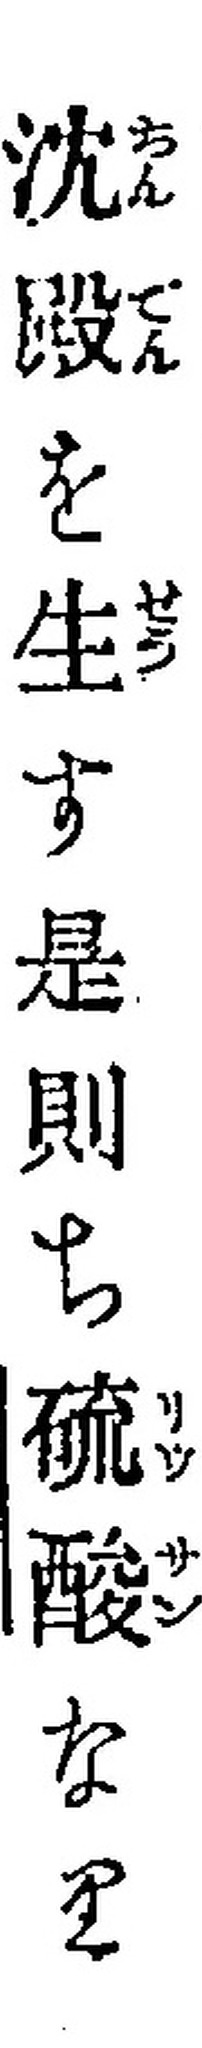沈澱を生す是則ち硫酸なり
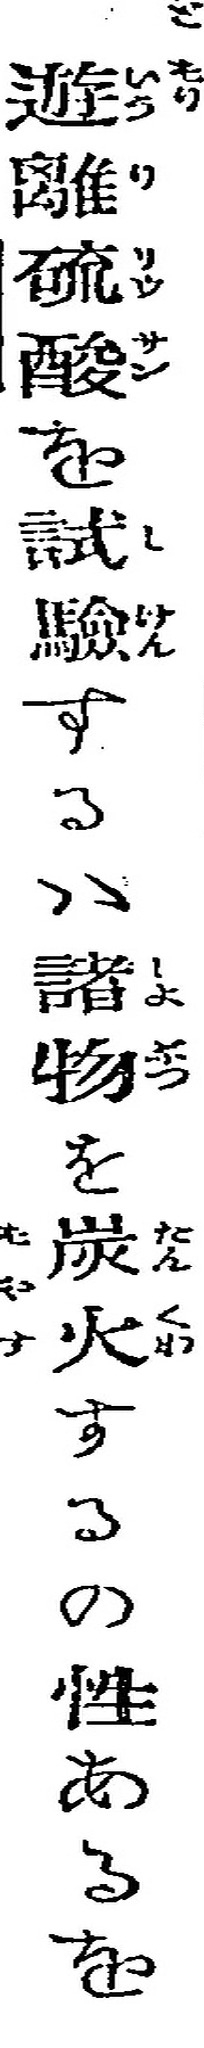遊離硫酸を試験するは諸物を炭化するの性あるを
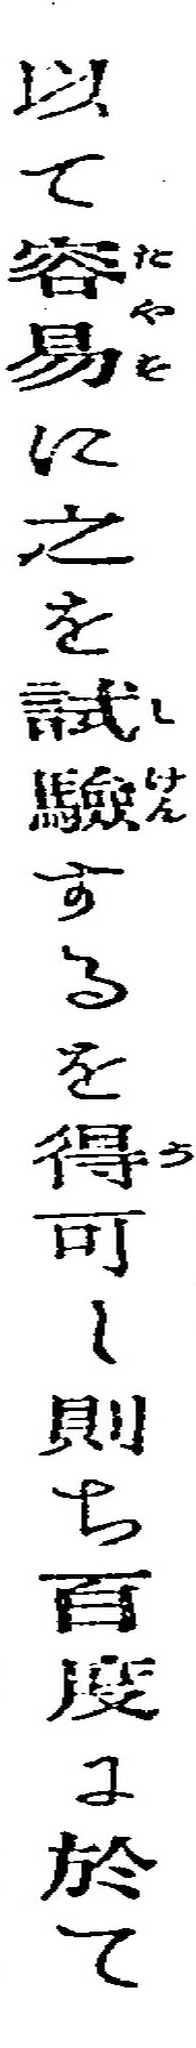以て容易に之を試験するを得可し則ち百度に於て
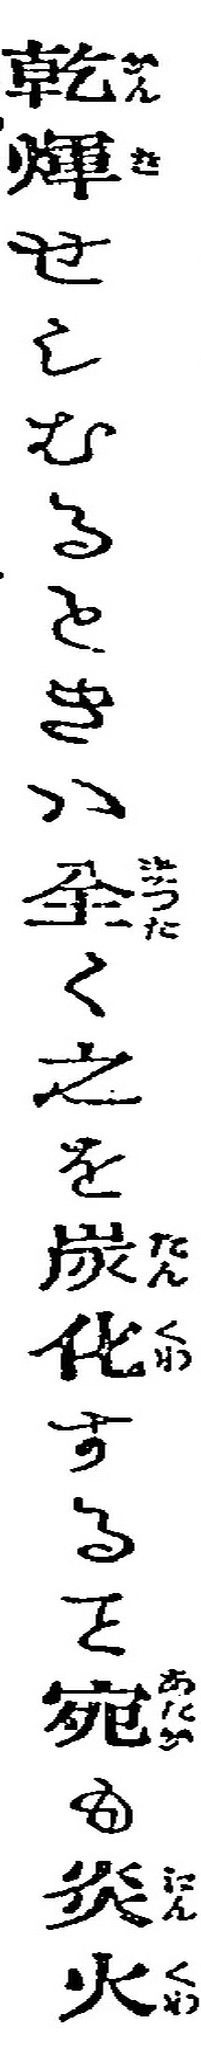乾煇せしむるときは全く之を炭化すること宛も炎火
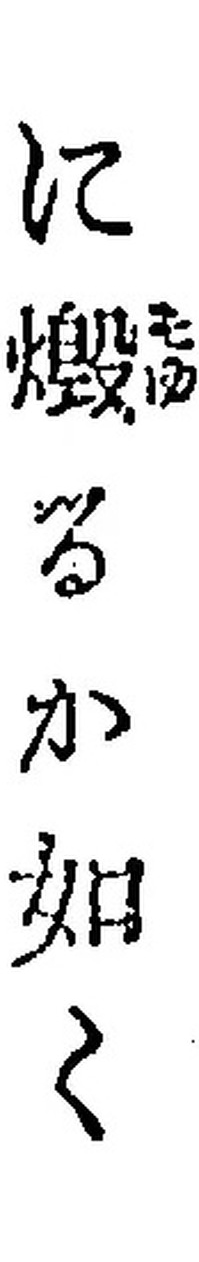に燬るか如く
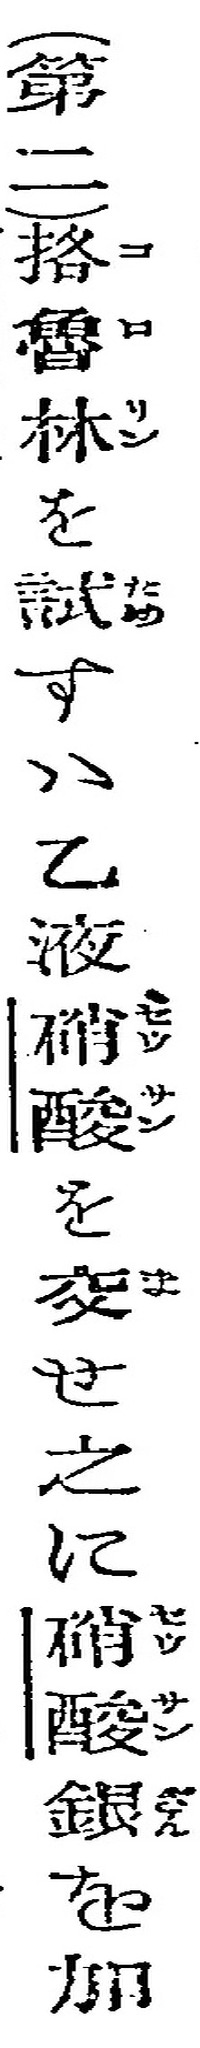[第二]挌魯林を試すは乙液硝酸を交せ之に硝酸銀を加
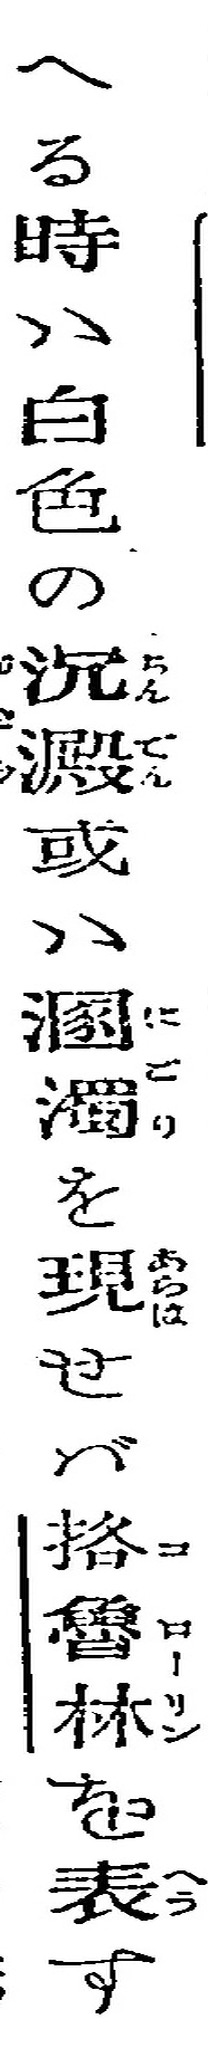へる時は白色の沈澱は溷濁を現せば挌魯林を表す
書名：飲水の心得 : 伝染病の予防
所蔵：国立国会図書館 National Diet Library, JAPAN
